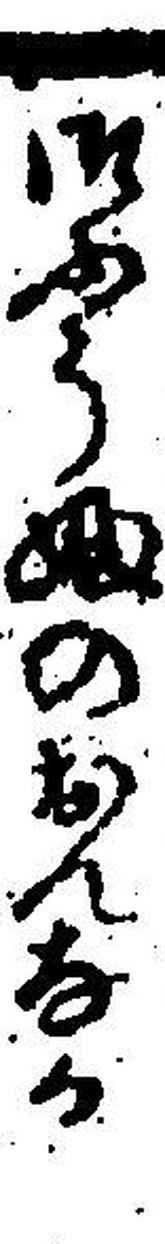御ふうふのおんなか
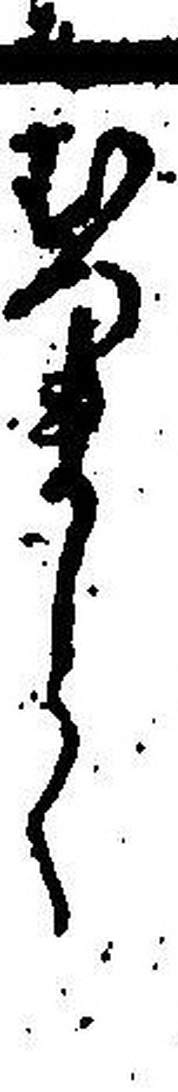むつましく
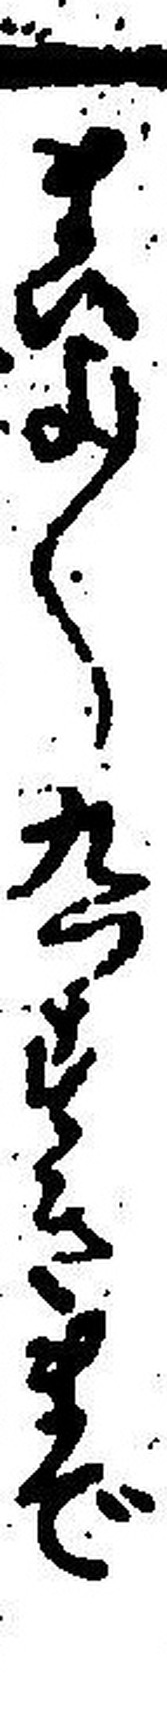まいよ〳〵九つすきまで
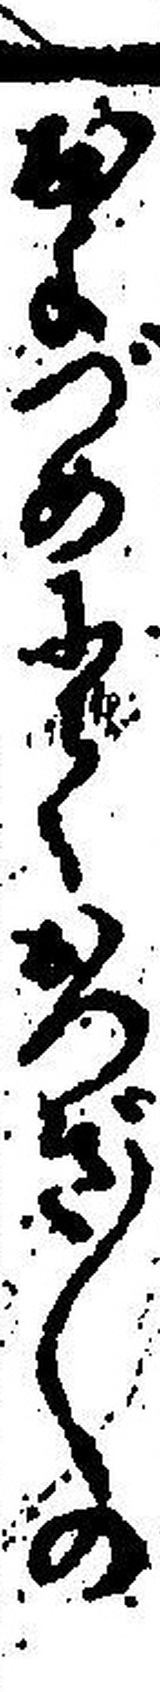およづめにておつぎ〳〵の
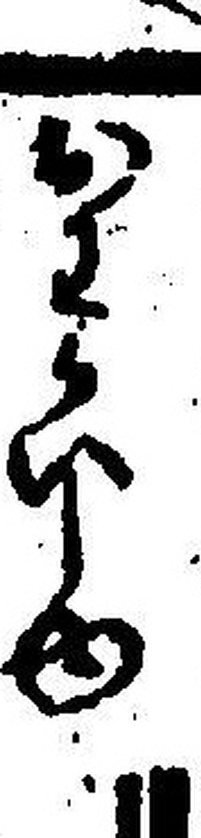おわらいしゆ
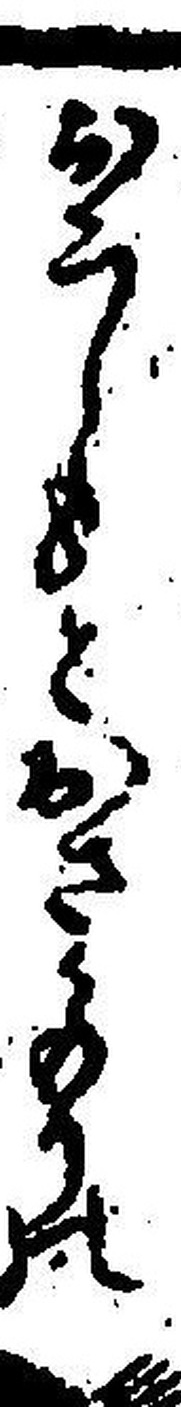おこしもとおさかもりの
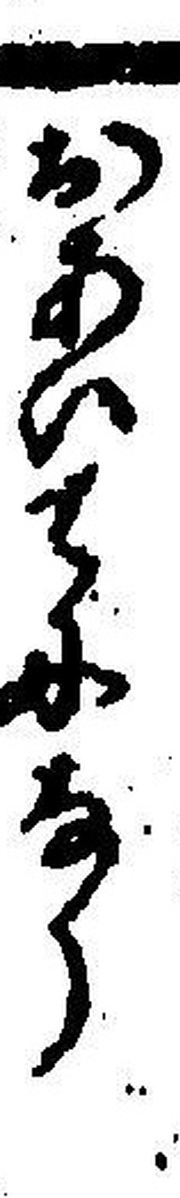おあいてになり
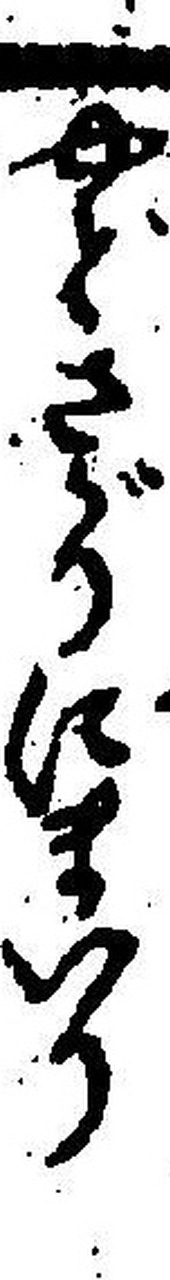やどさがりにまいり
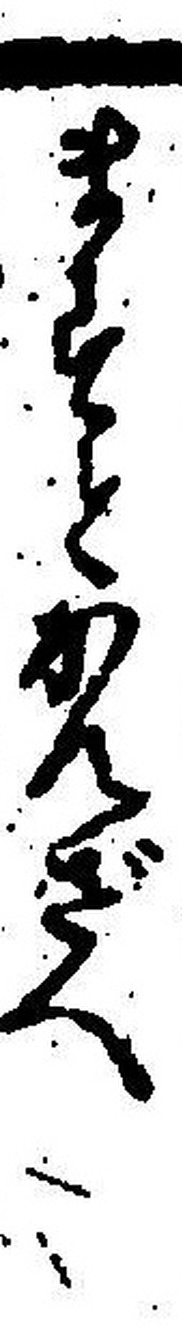ますとかんざへ
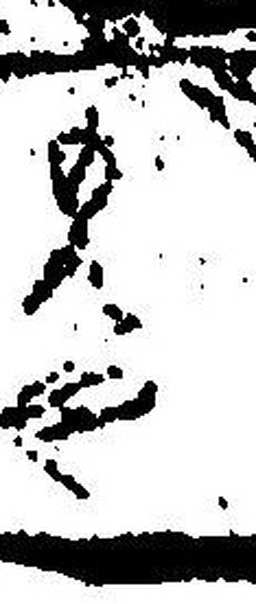もんや
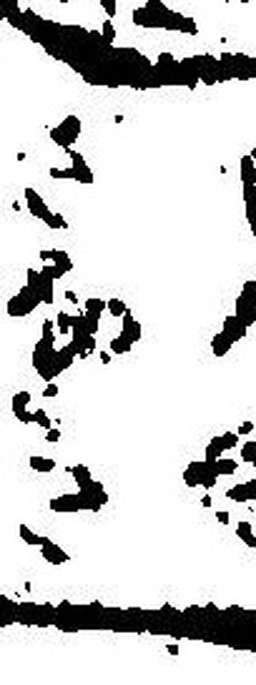さなき
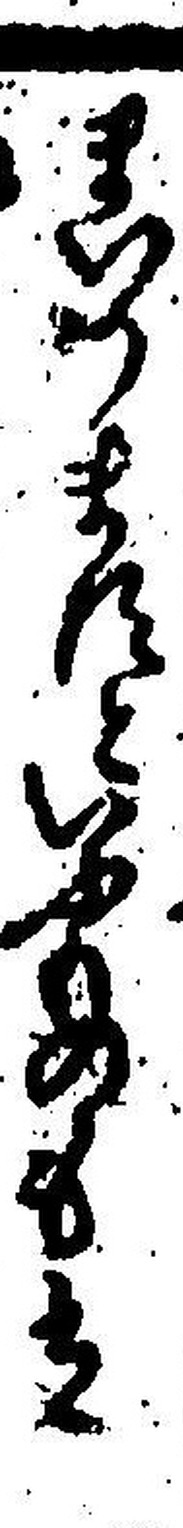まいりますといふものも立
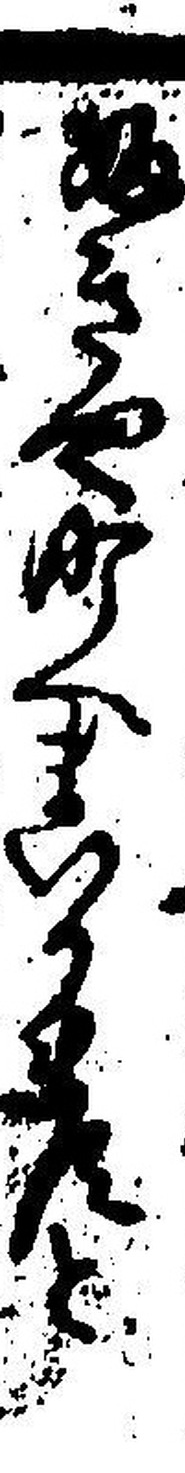ふきや町へまいりますと
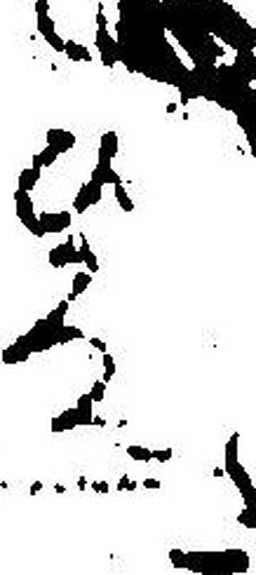ひかつ
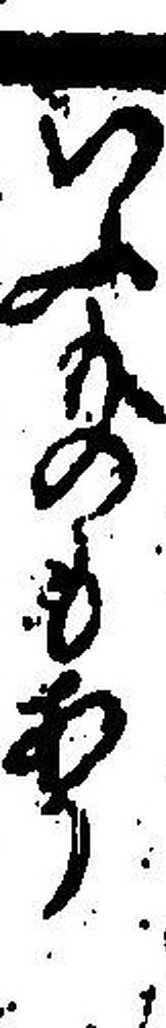いふものもあり
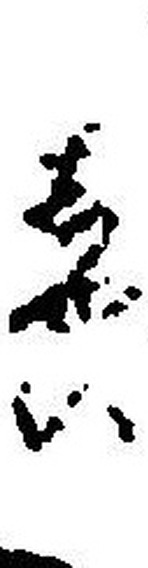しやい
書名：御代参牛時詣 / 市場通笑作
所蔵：東京大学総合図書館 General Library in the University of Tokyo, JAPAN
